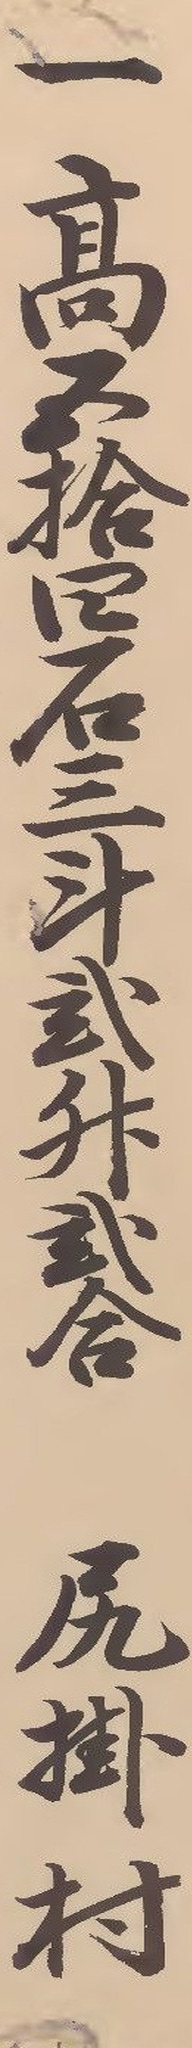一高五拾四石三斗弐升弐合尻掛村
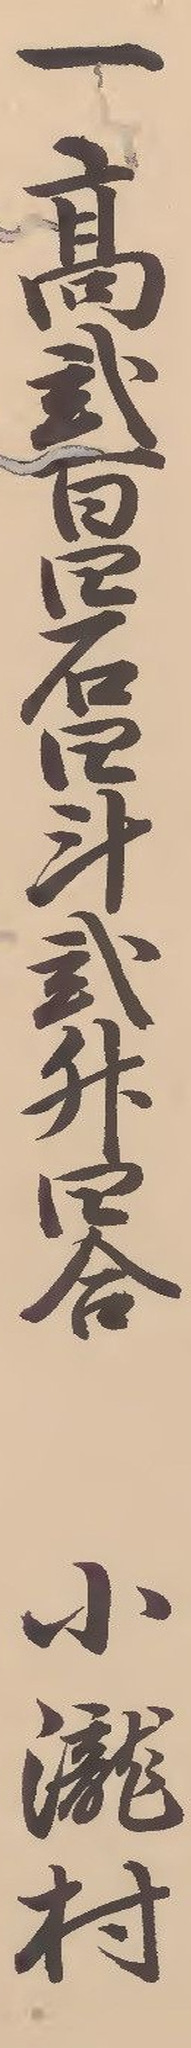一高弐日四石四斗弐升四合小滝村

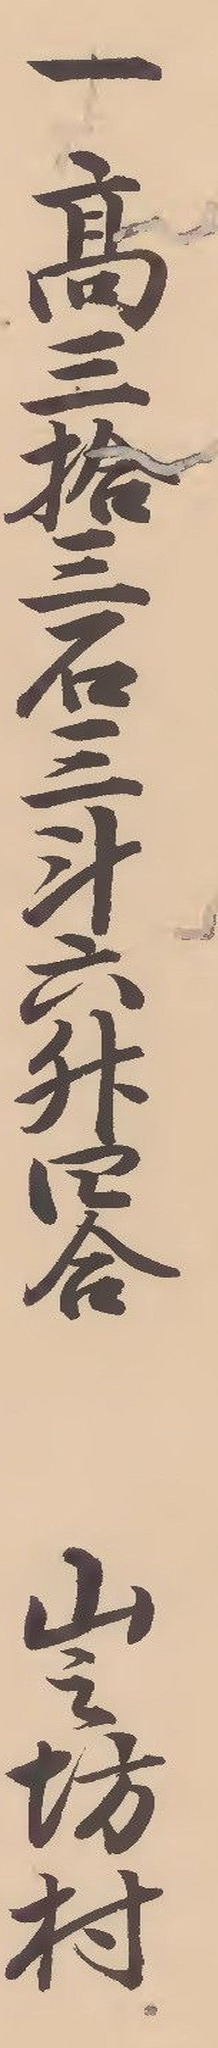一高三拾三石三斗六升四合山之坊村
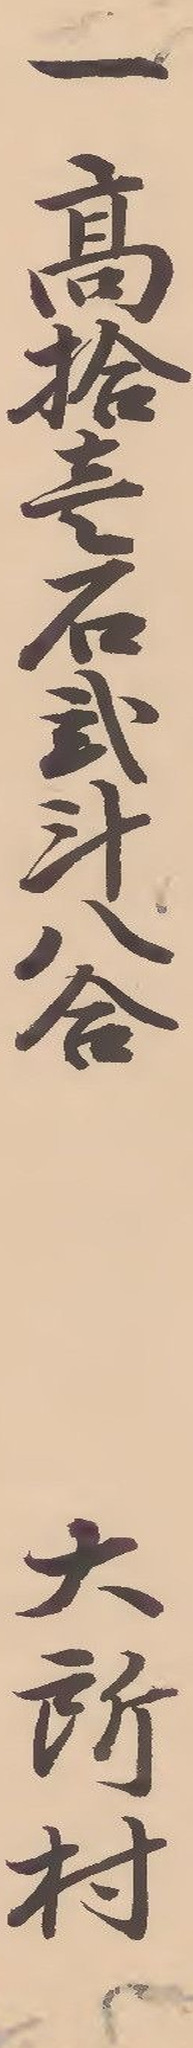一高拾壱石弐斗八合大所村
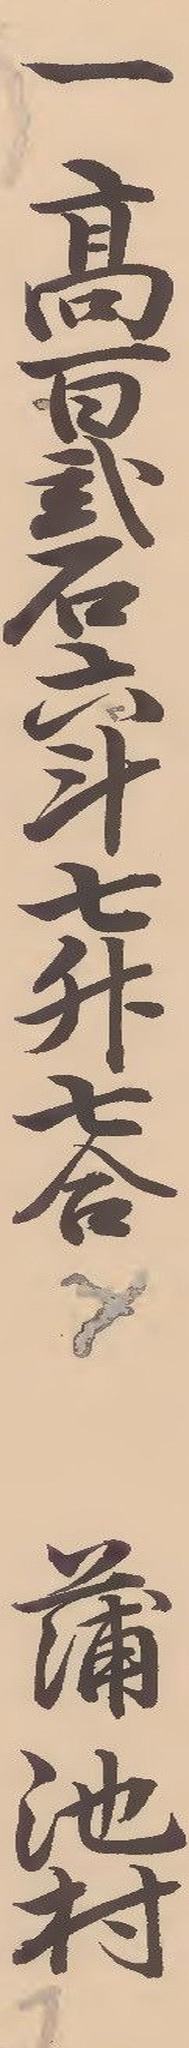一高百弐石六斗七升七合蒲池村
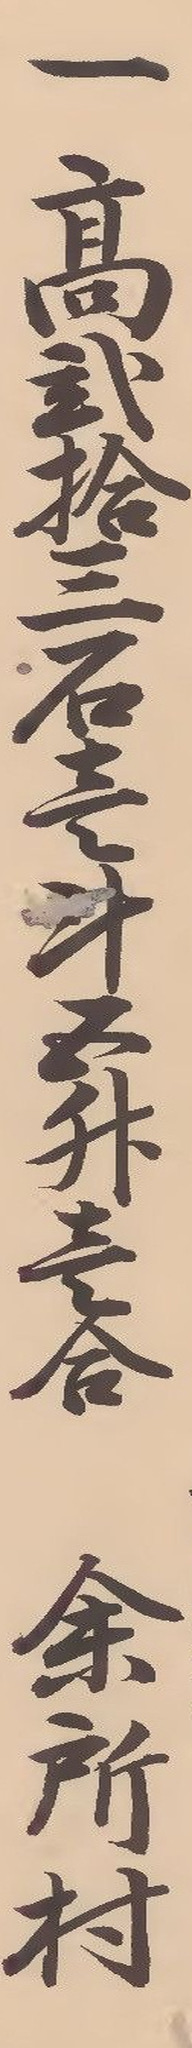一高弐拾三石壱斗五升壱合余所村
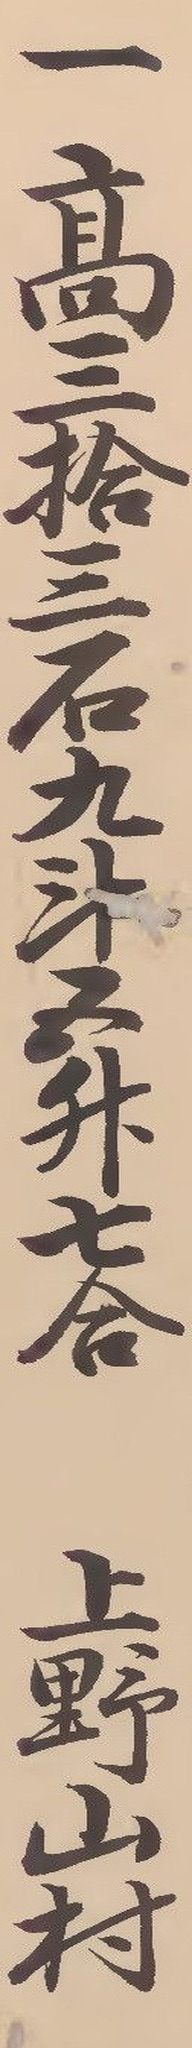一高三拾三石九斗五升七合上野山村
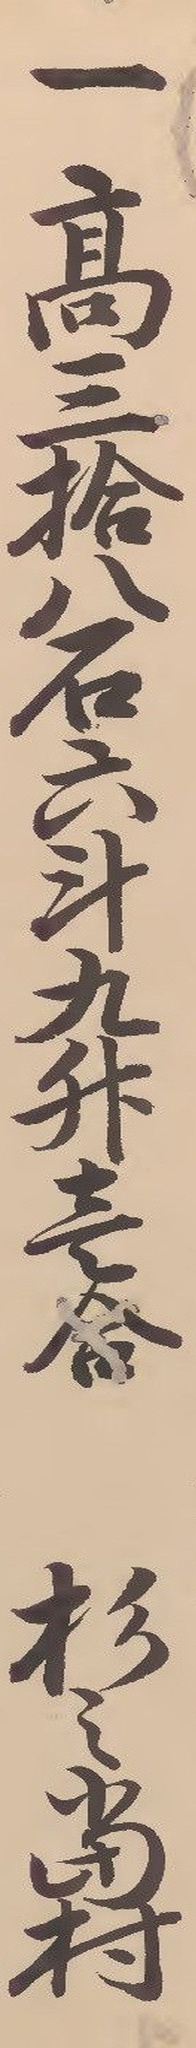一高三拾八石六斗九升壱合杉之当村
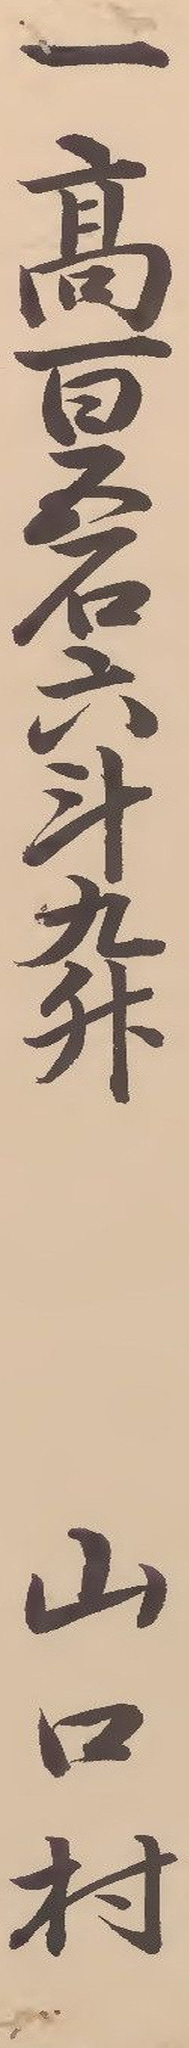一高百五石六斗九升山口村
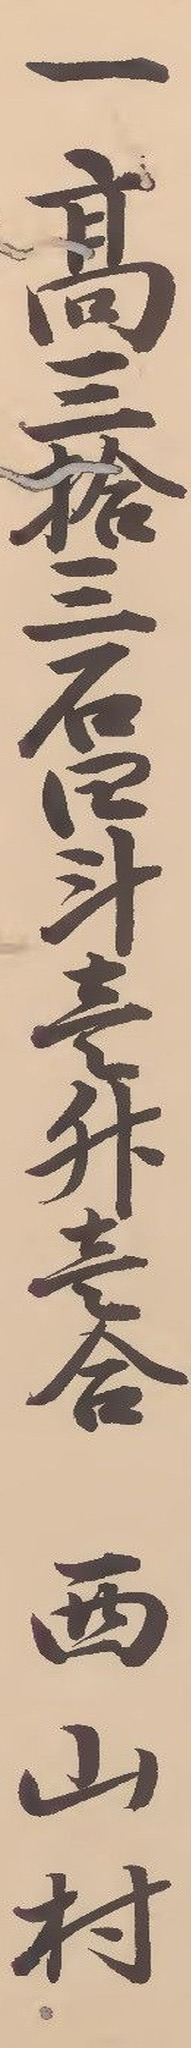一高三拾三石四斗壱升壱合西山村

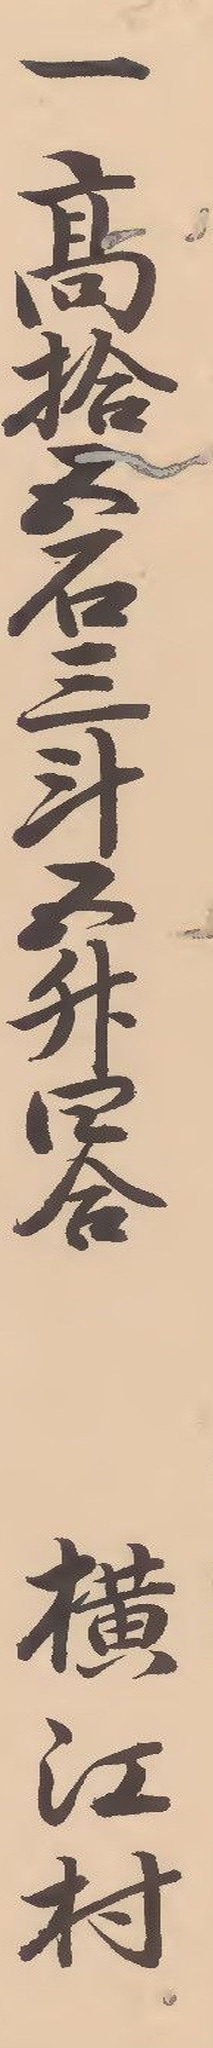一高拾五石三斗五升四合横江村
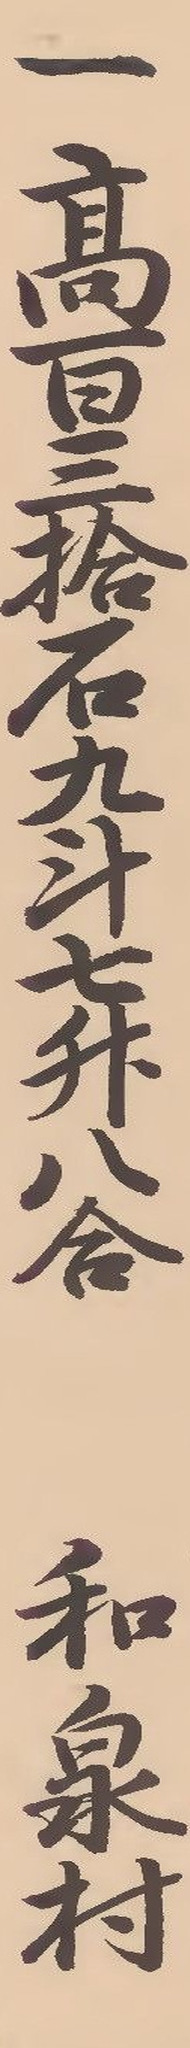一高百三拾石九斗七升八合和泉村
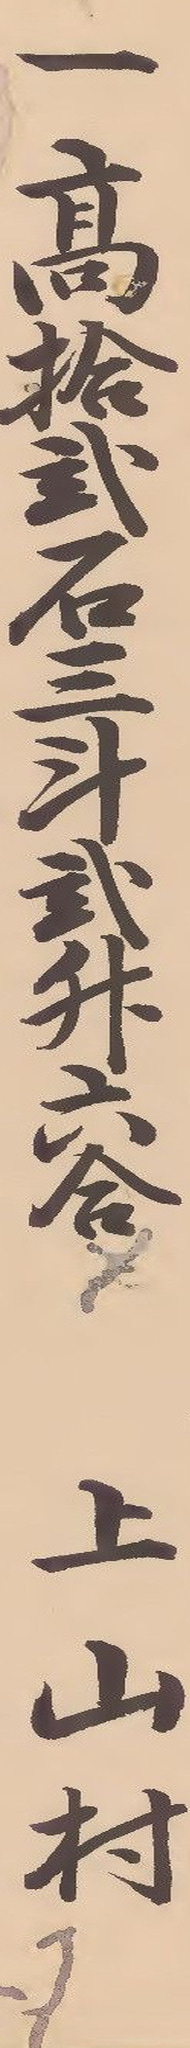一高拾弐石三斗弐升六合上山村
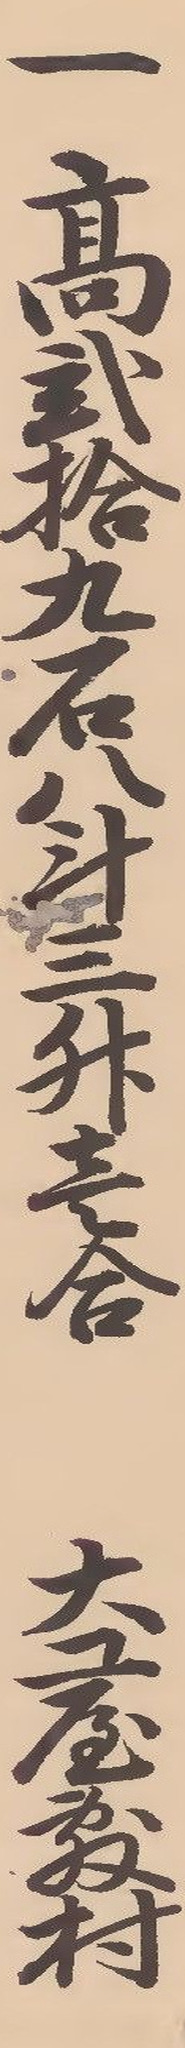一高弐拾九石八斗三升壱合大工屋敷村
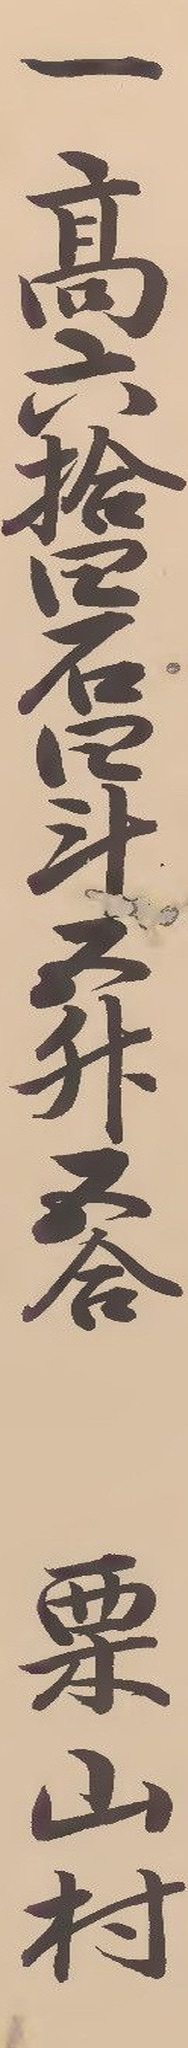一高六拾四石四斗五升五合栗山村
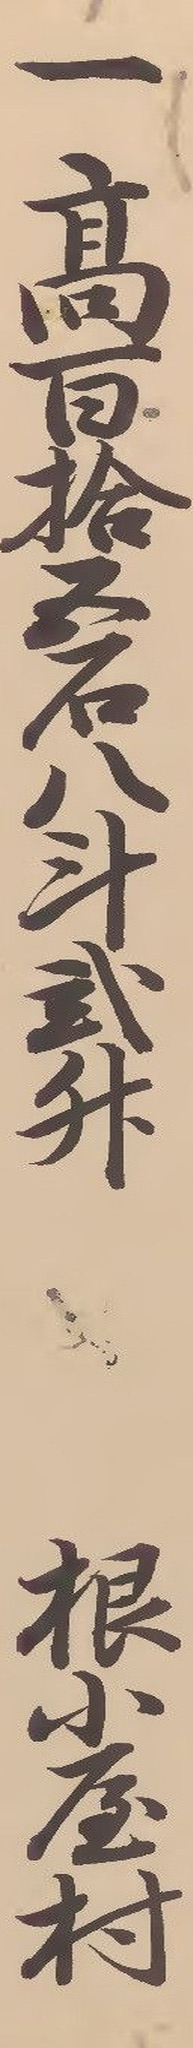一高百拾五石八斗弐升根小屋村
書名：越後国郷帳　上
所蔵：国立公文書館 National Archives of Japan
